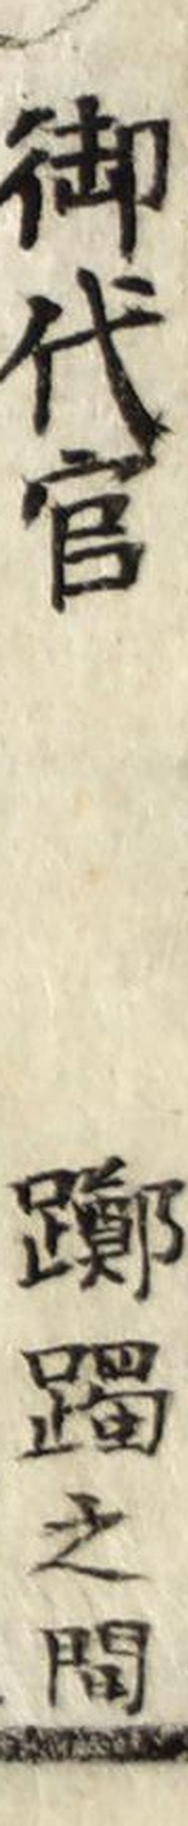○御代官躑躅之間
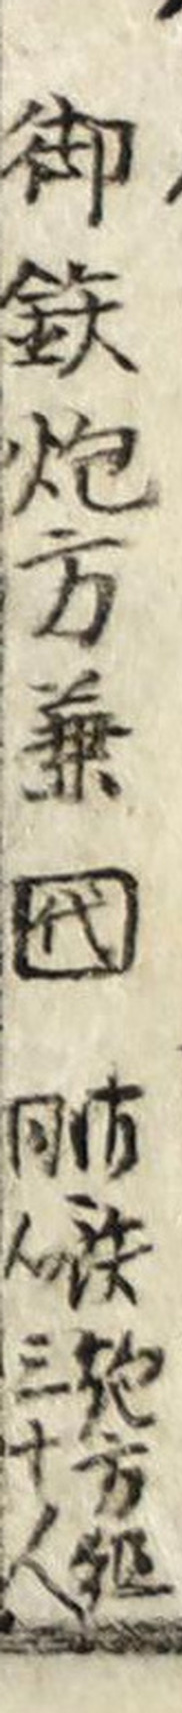御鉄砲方兼代御鉄砲方組
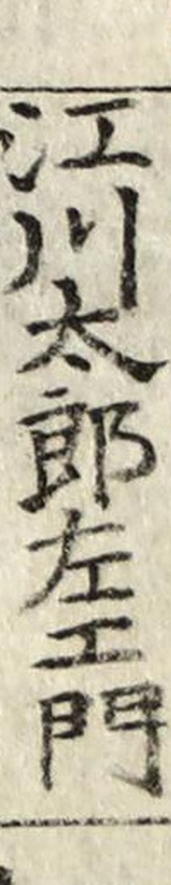江川太郎左衛門
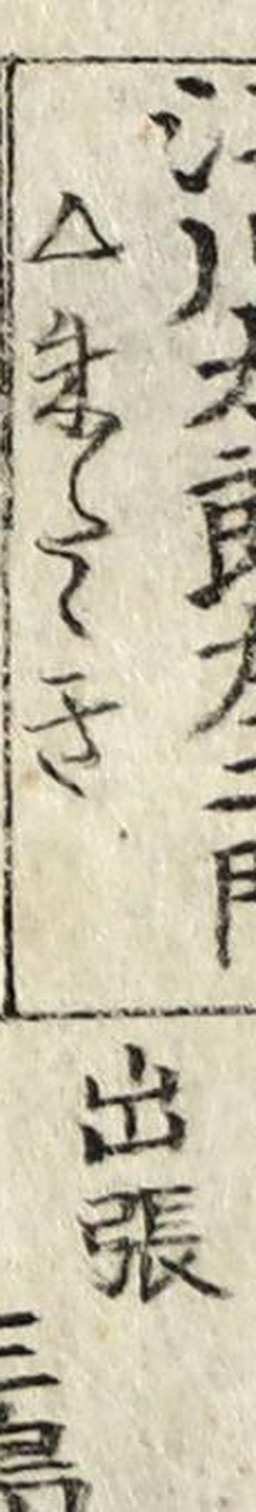△朱たヽき出張
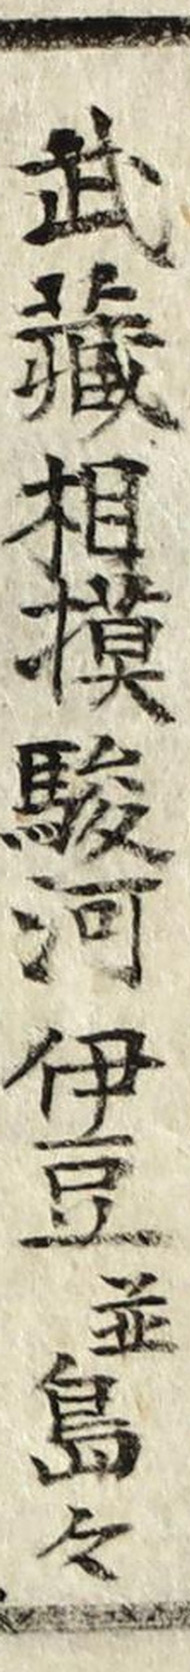武蔵相模駿河伊豆並島々
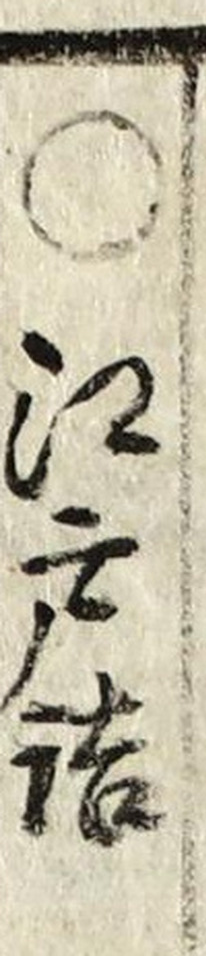○江戸詰
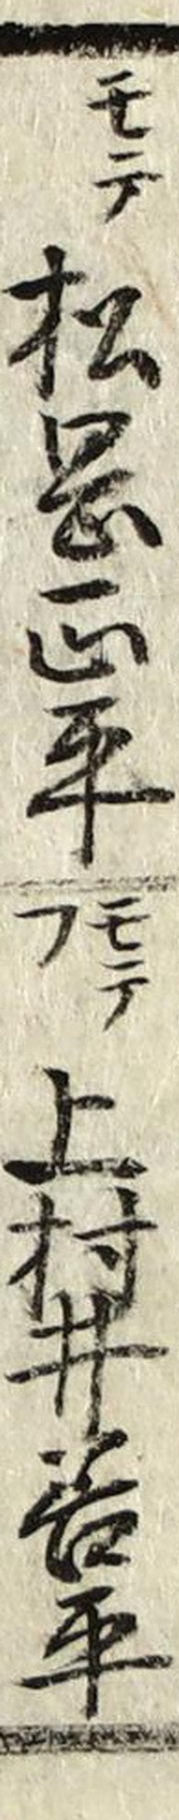モテ松岡正平モテ上村井善平
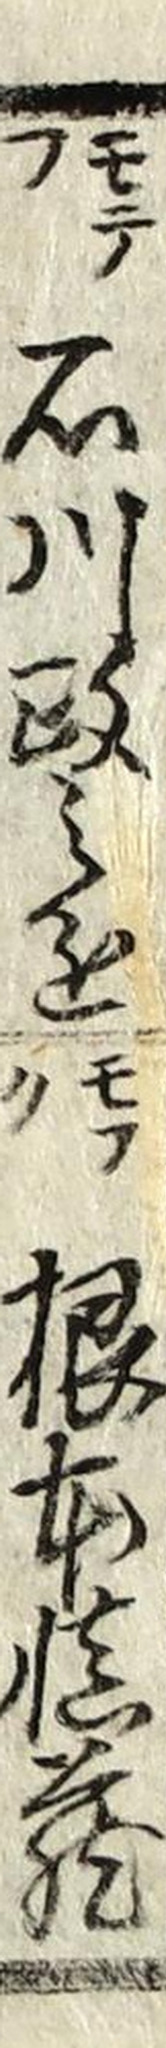モテ石川政之進モフ根本慎蔵
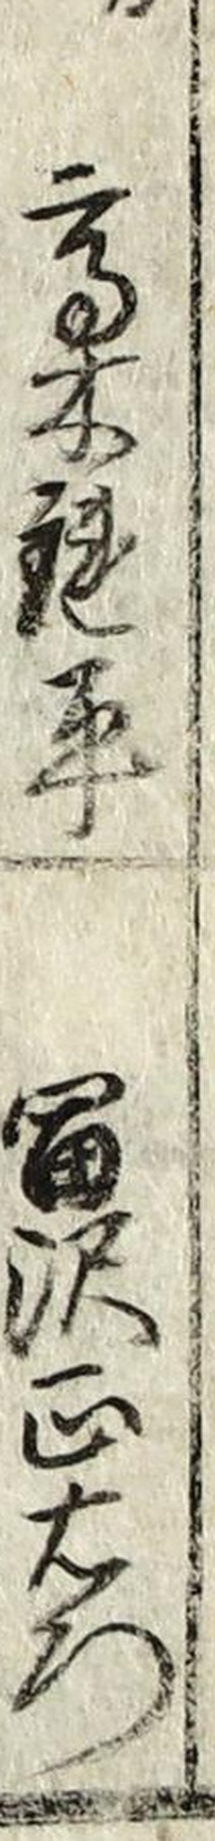カ高木鍵平冨沢正右衛門
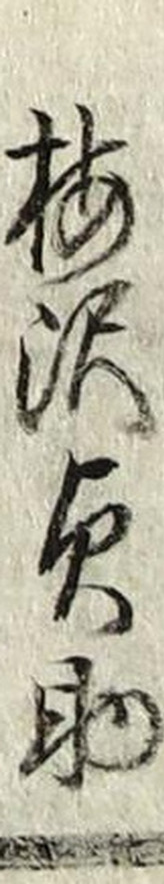梅沢貞助
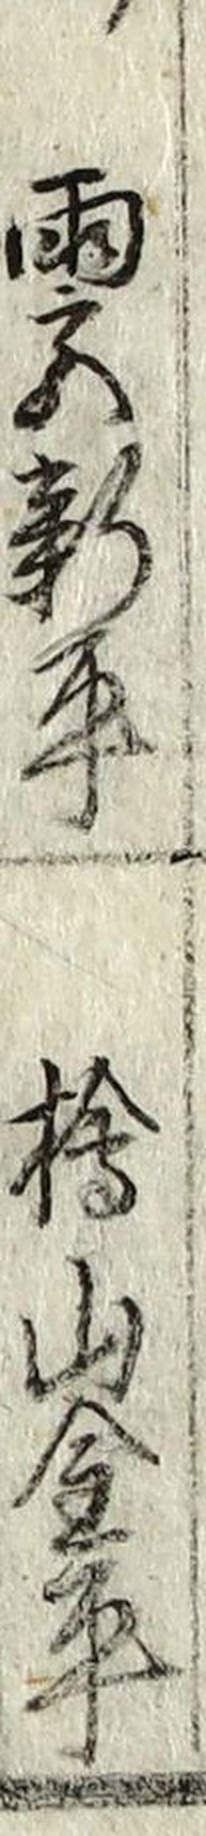フ雨宮新平桧山金平
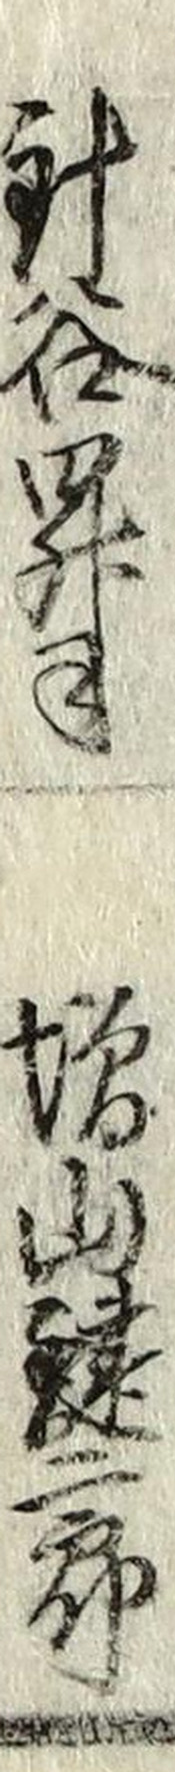針谷昇司増山鍵ニ郎
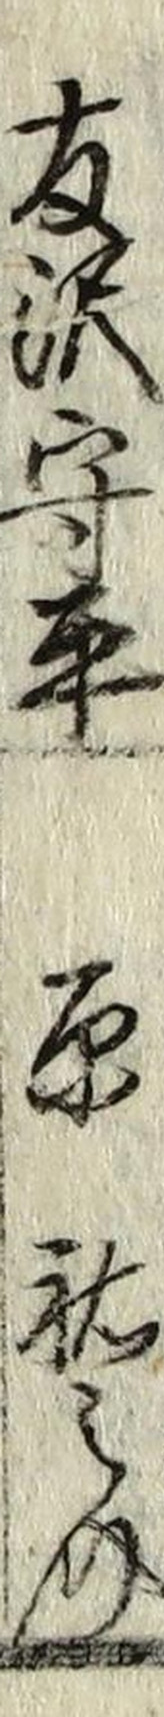友沢守平原祐之介
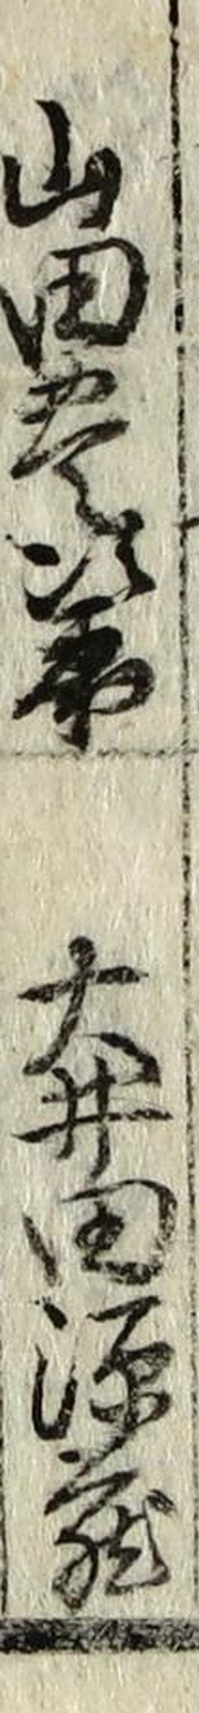山田尽次郎大井田源蔵
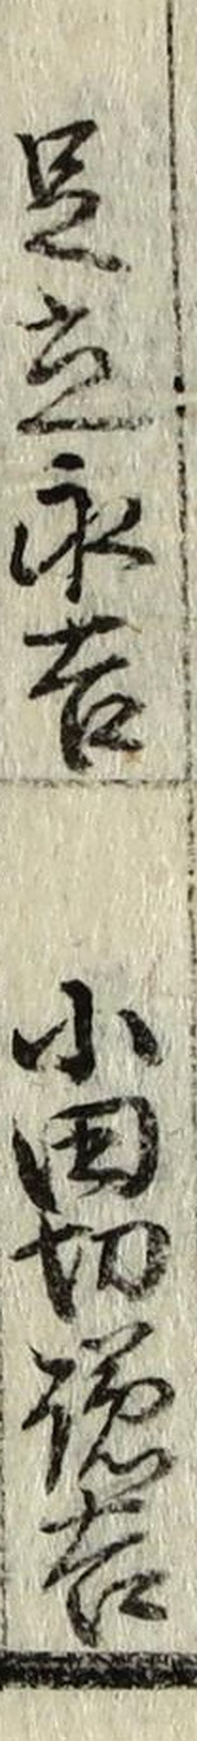足立永吉小田切謙吉
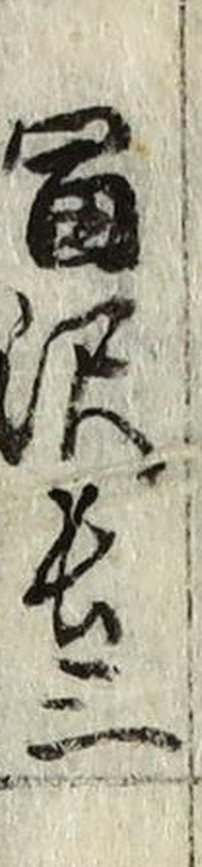冨沢長三
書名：（全国郡代・代官所諸役人名列）
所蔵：福井県文書館 Fukui Prefectural Archives
